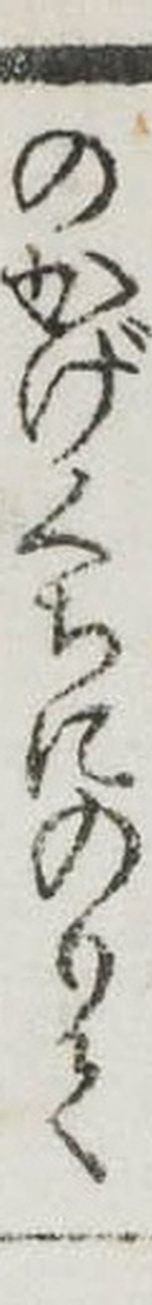のかげくちにのりて
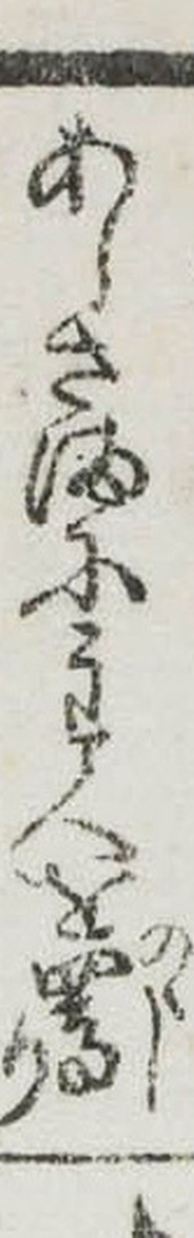あしさまに主人を罵り
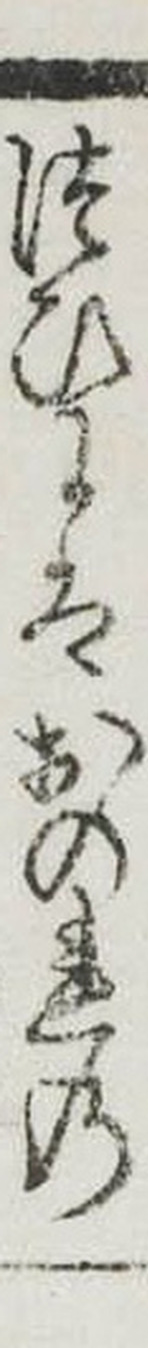つひにはおのれの
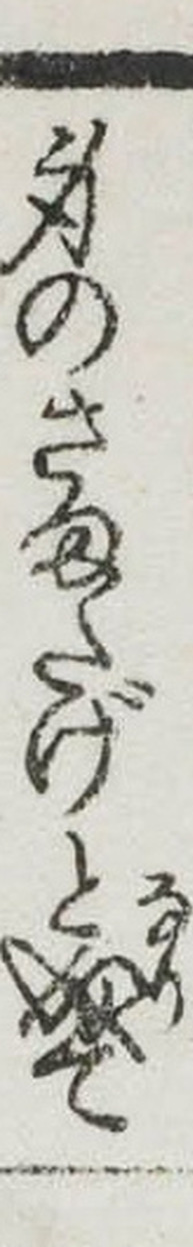身のさまたげと成て
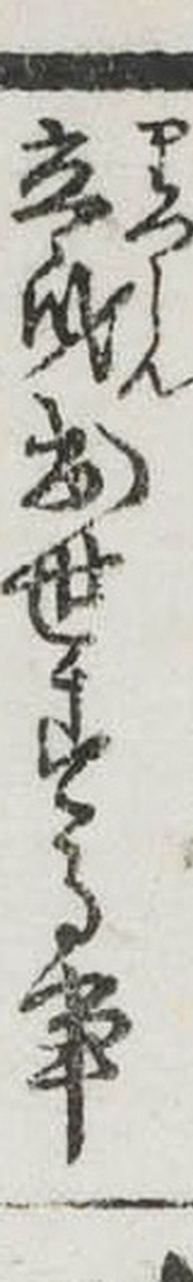立身出世する事
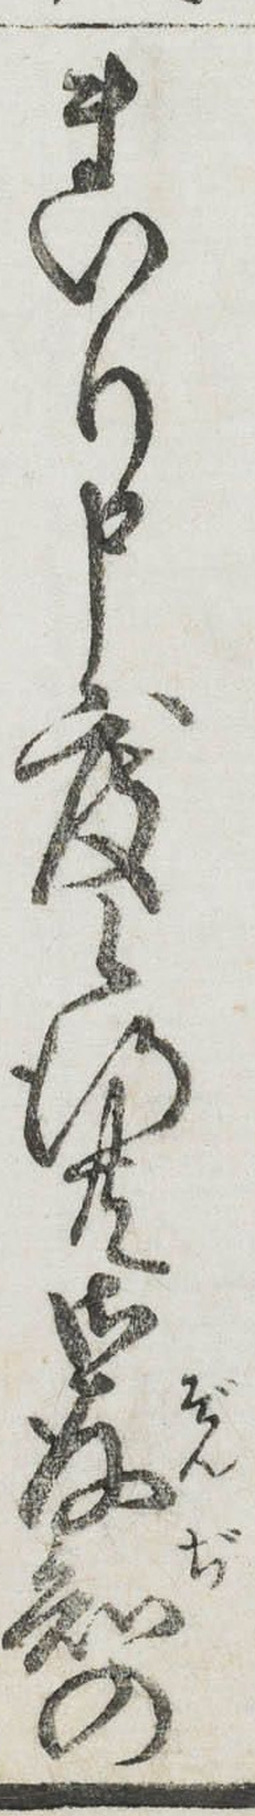まいり申度候得共御存知の
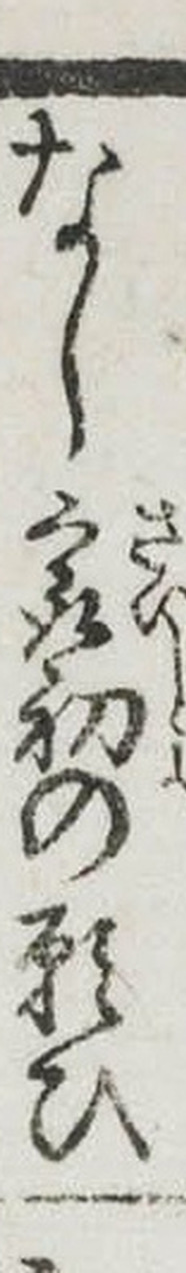なし最初の願ひ
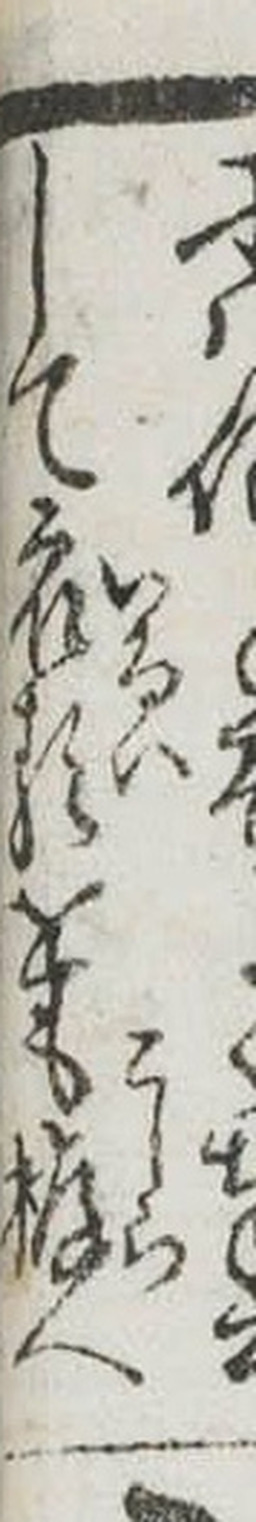して衣類をも拵へ
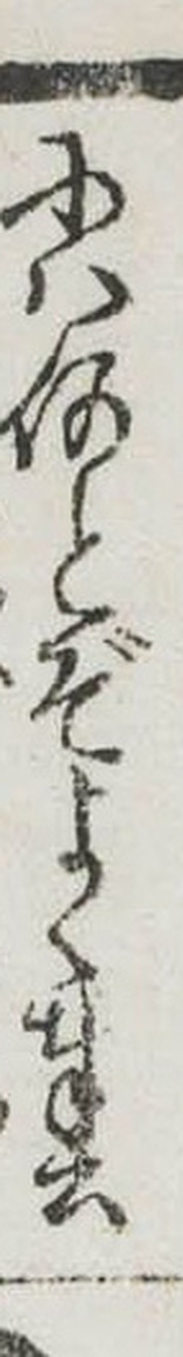には何とぞよく奉公
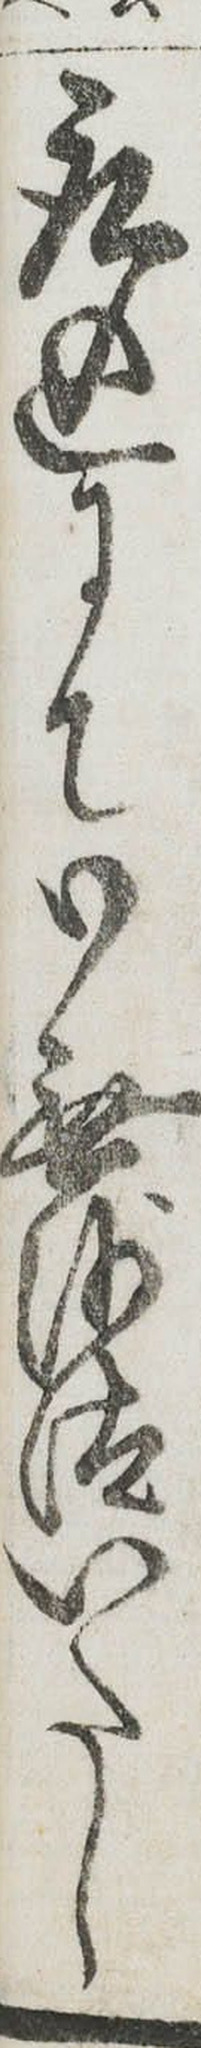取込にて御無沙汰いたし
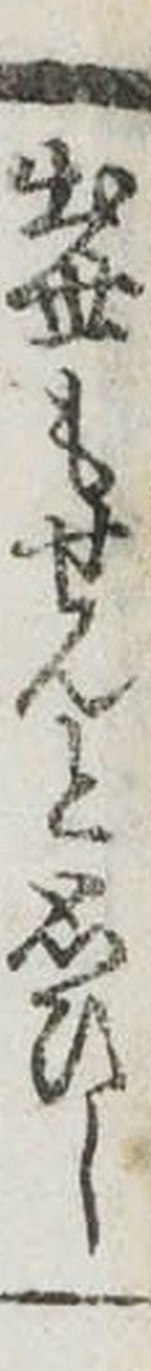出世もせんと思ひし
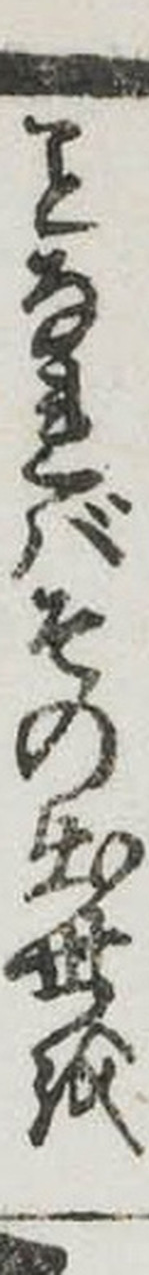ことなればその出世を
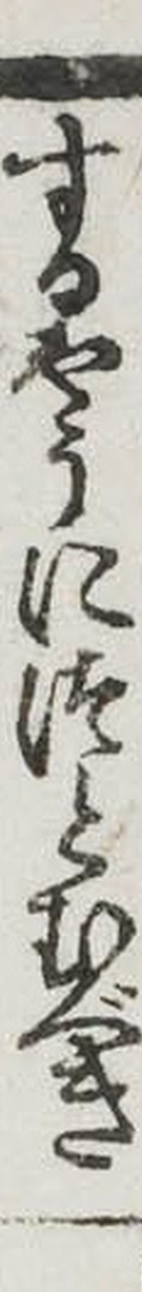するやうにつとむべき
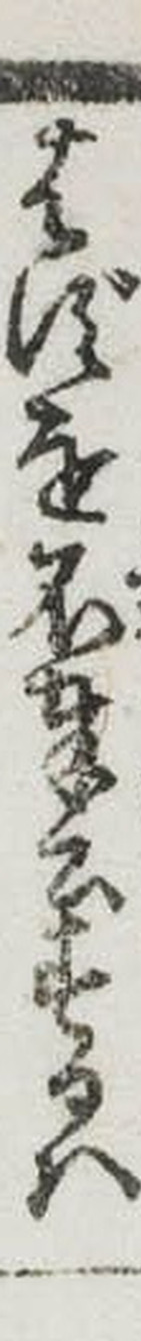はずを不奉公するは
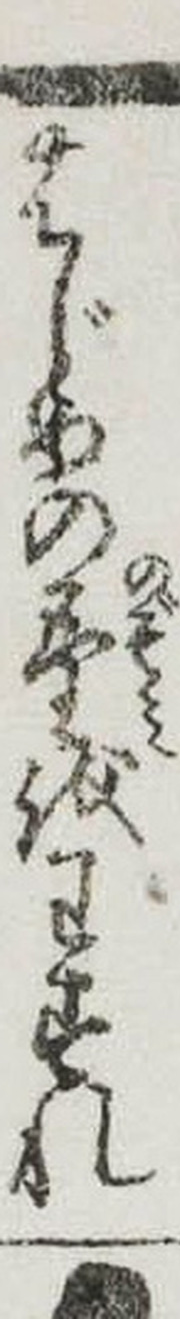はじめの望をわすれ
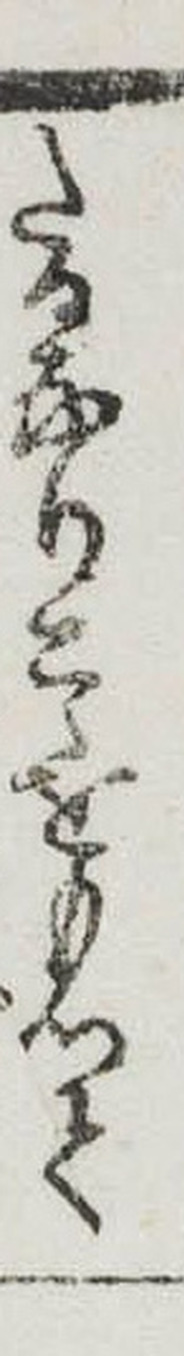たるなりこゝをもつて
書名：頭書萬用婦人手紙之文言
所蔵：東京学芸大学教育コンテンツアーカイブ
